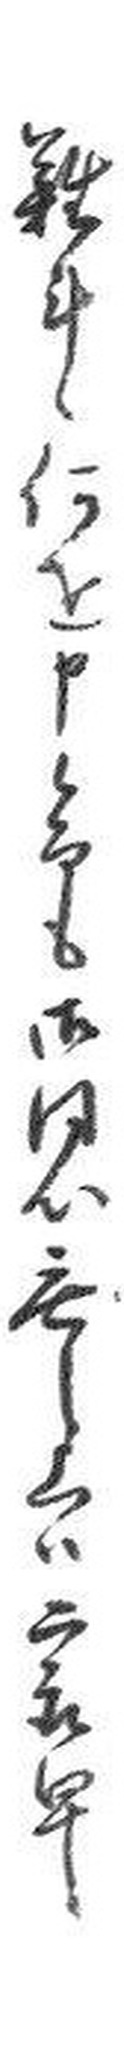難計候何を申候而も御同心無之上ㇵ最早
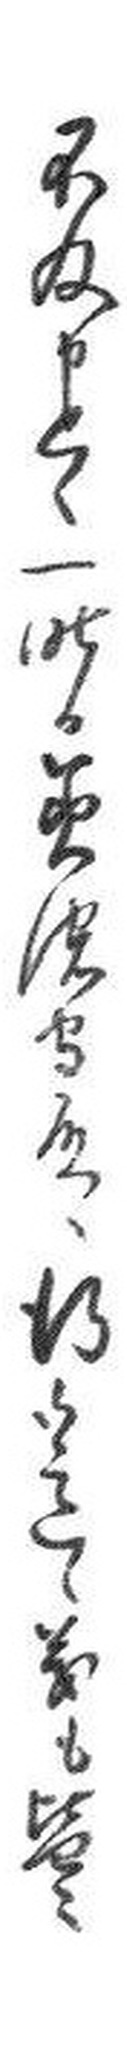不及申上候一昨日美濃守殿ヘ得御意候義も皆々
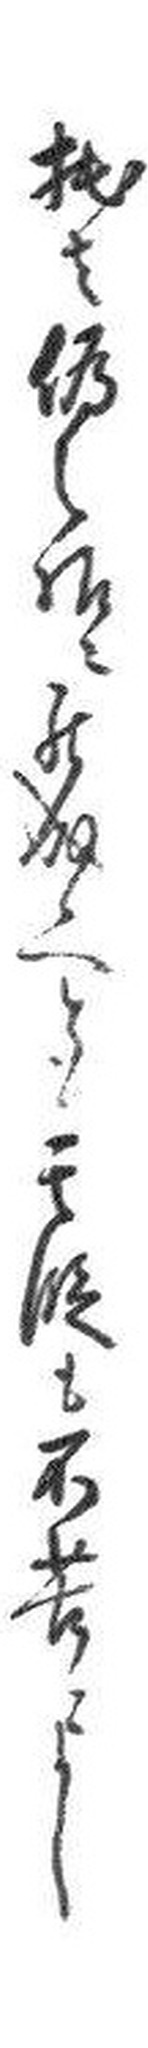拙者偽之様ニ罷成候へとも其段も不苦候よし
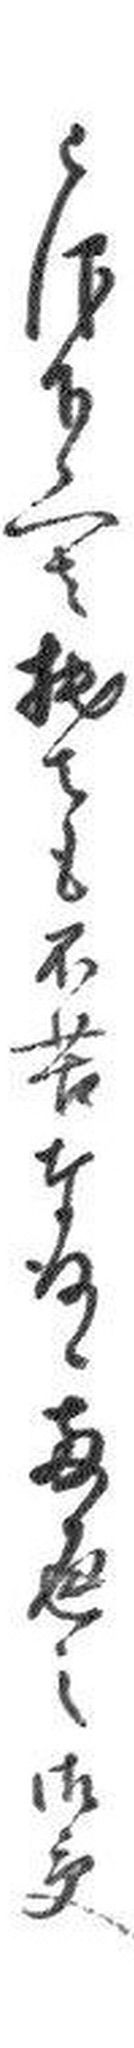被仰下候へ者拙者も不苦奉存候両通之御受
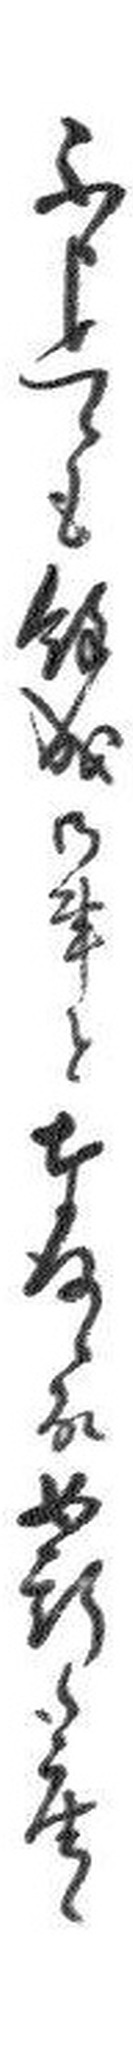不申上候も余成御事と奉存候故如斯御座候
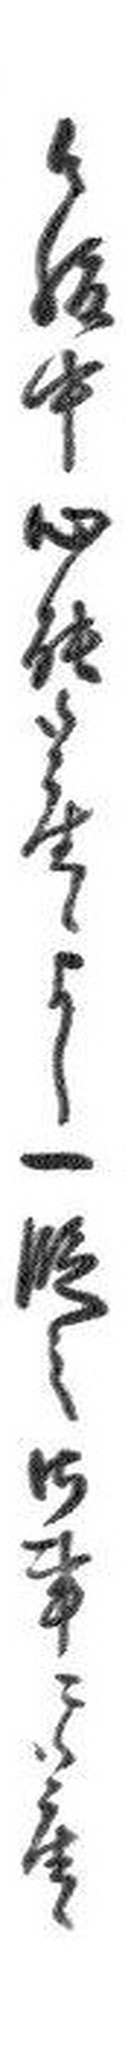御報中心能御座候よし一段之御事ニ御座候
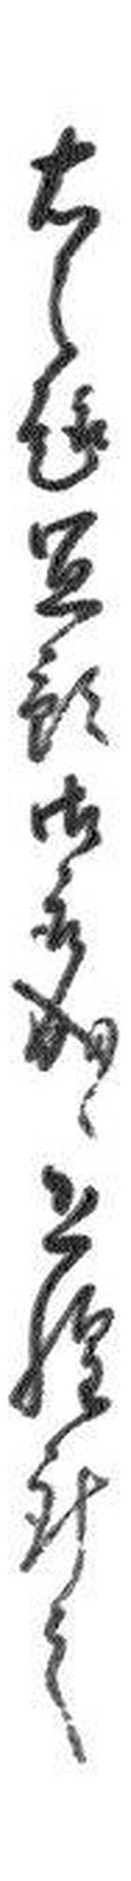右之趣宜預御取成候恐惶謹言
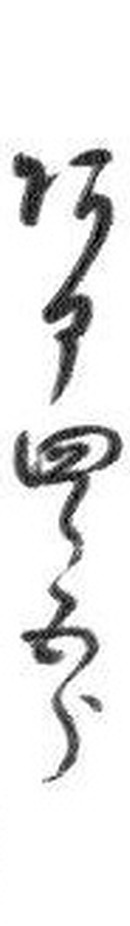阿部四郎五郎
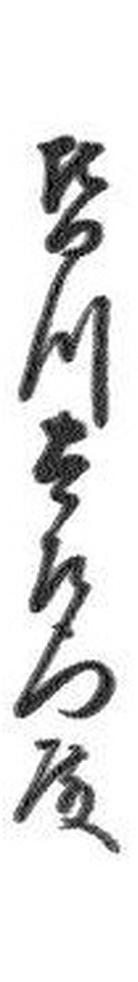皆川太左衛門殿
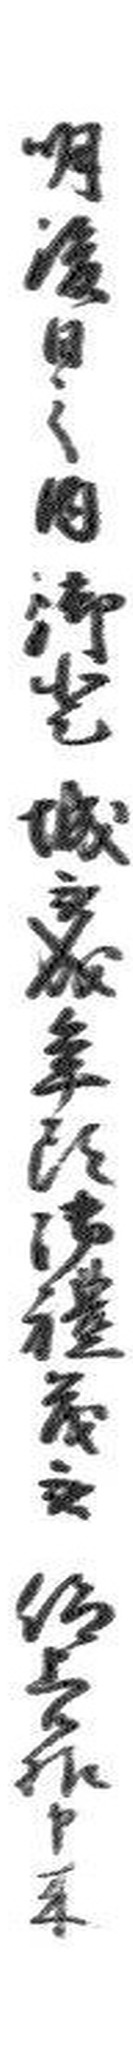明後日之内御登城被成年頭御礼茂被仰上候様申来
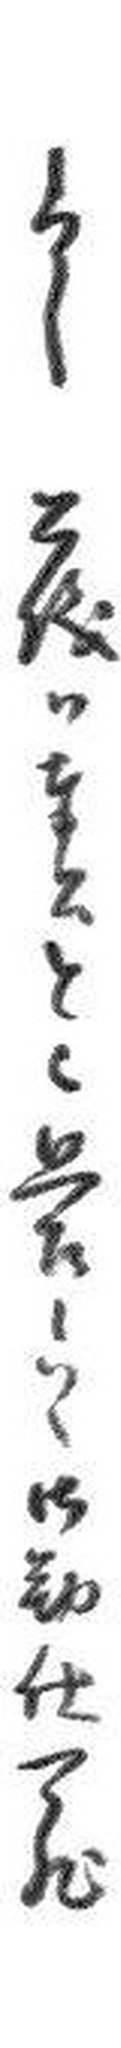尚々公儀ㇵ奉公と被思召候ㇵゝ御勤仕可然
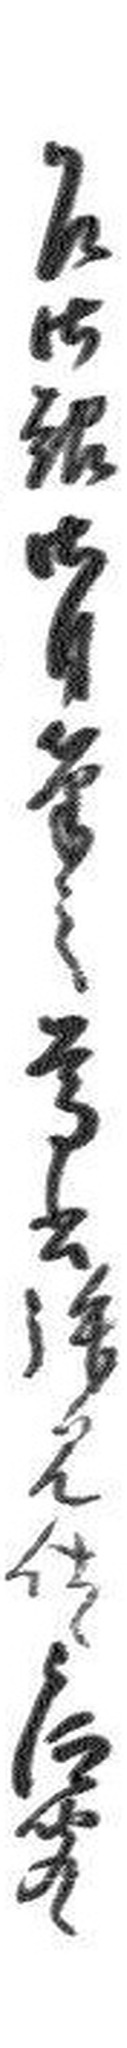乍御報御自筆之尊書拝見仕候被仰聞
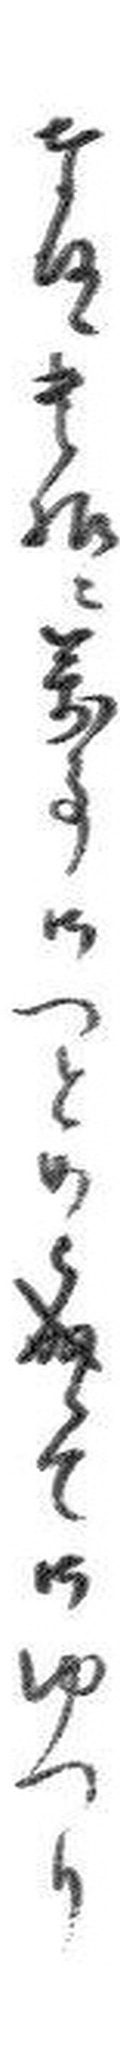奉存候貴様ニ万事御つとめ被成候て御ゆつり

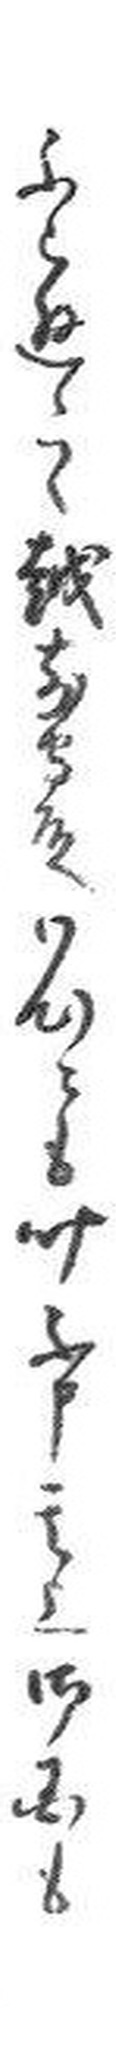不被遊候ㇵゝ越前守殿御心ニも叶不申其上御国も
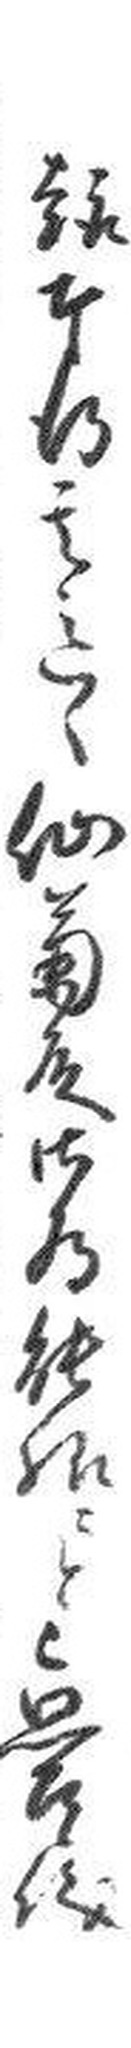趣奉得其意候仙菊殿御為能様ニと被思召候儀
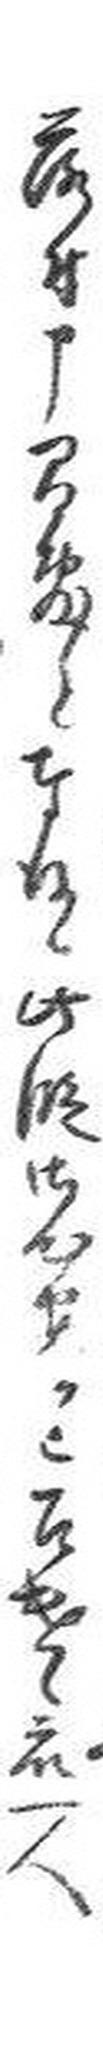落付申間敷と奉存候此段御心安ク被召遣候衆一人
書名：家譜 十一 昌親公 従延宝二年到延宝四年八月
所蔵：福井県文書館 Fukui Prefectural Archives
